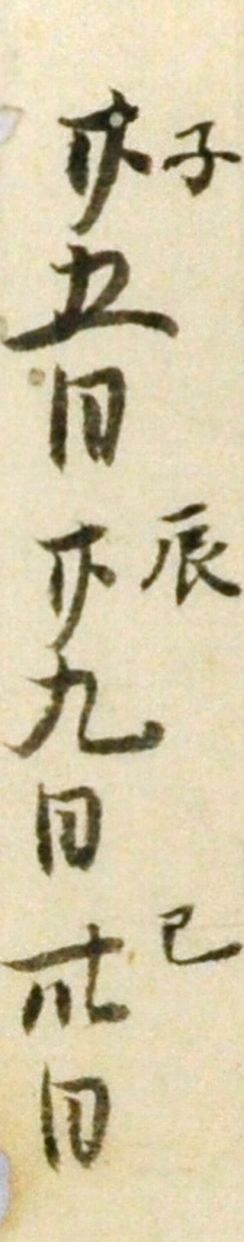廿五日廿九日卅日
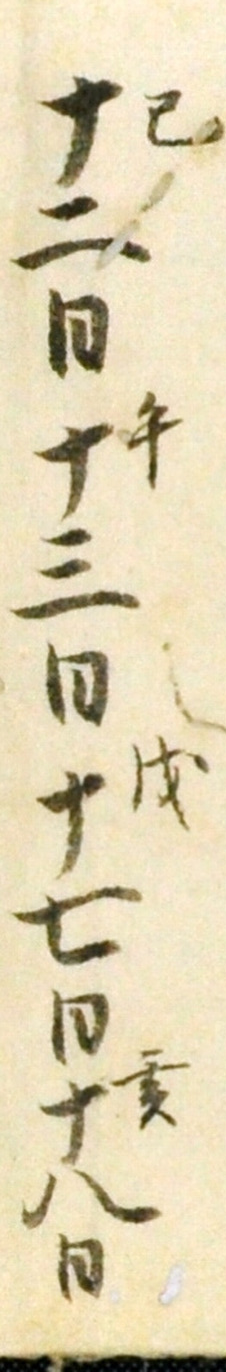十二日十三日十七日十八日
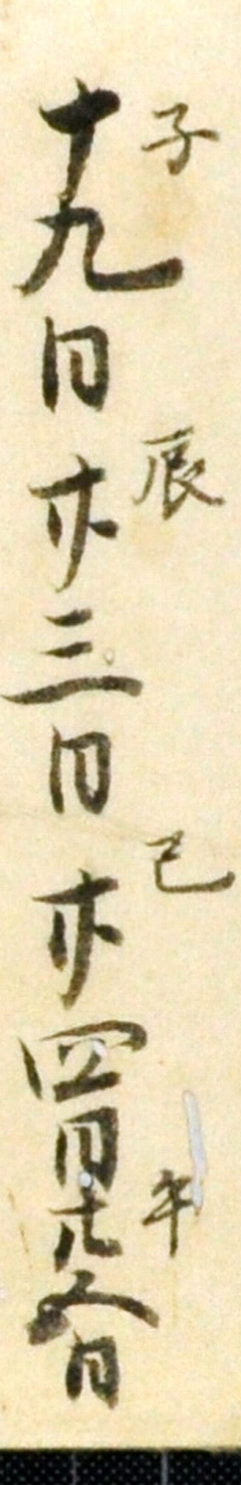十九日廿三日廿四日廿五日
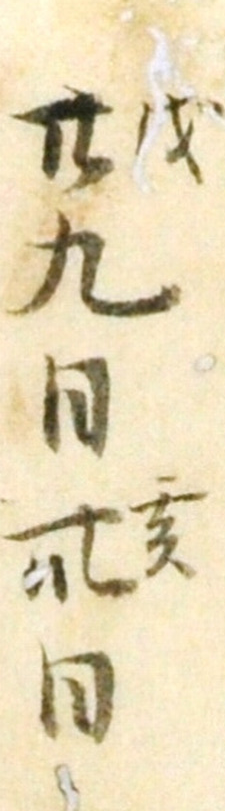廿九日卅日
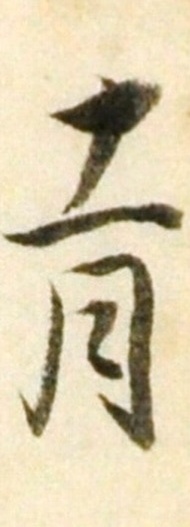十一月
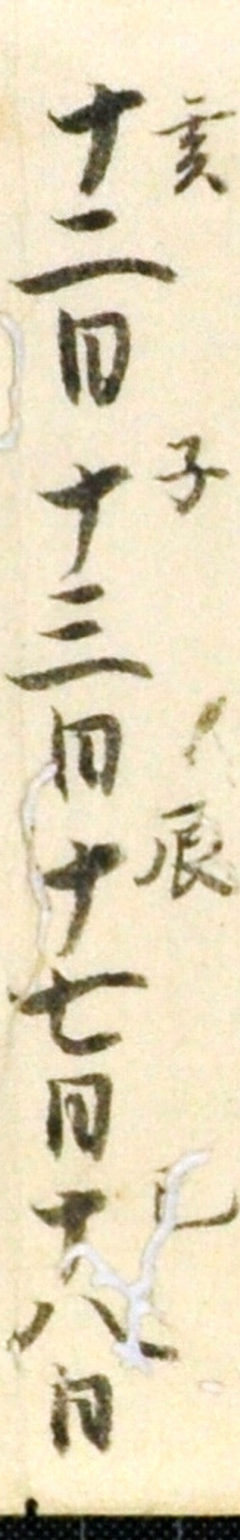十二日十三日十七日十八日
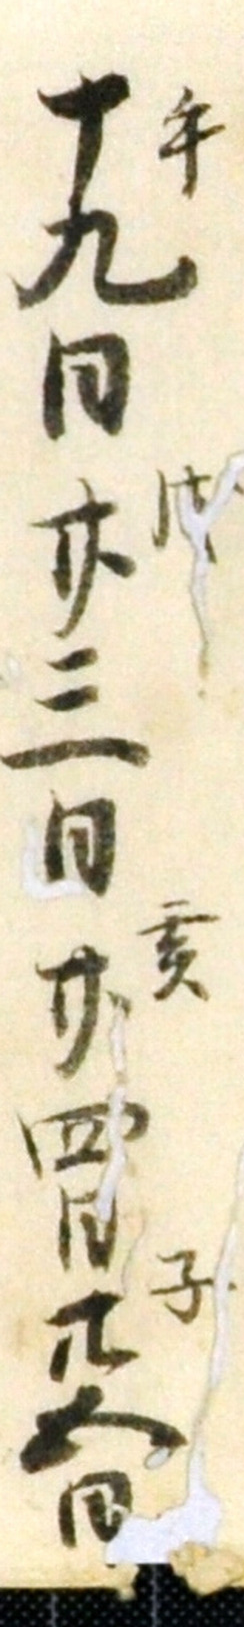十九日廿三日廿四日廿五日
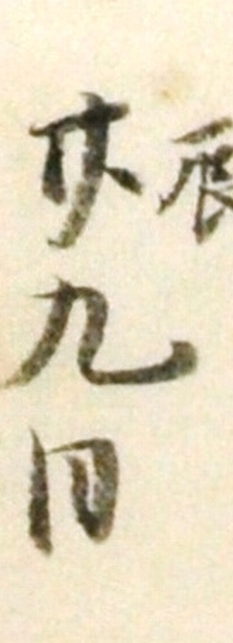廿九日
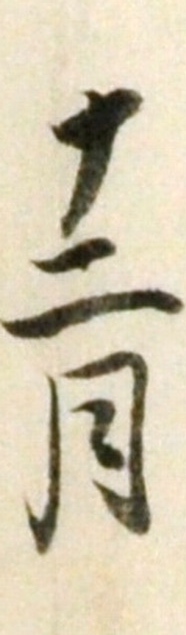十二月

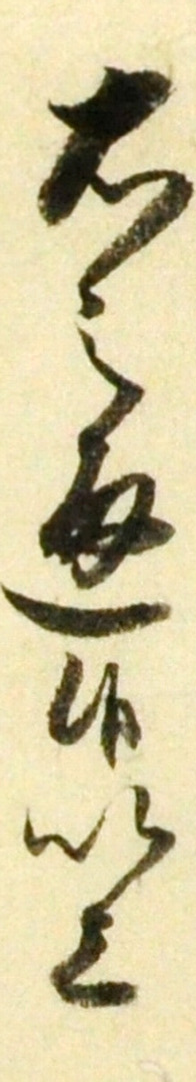右之通候以上
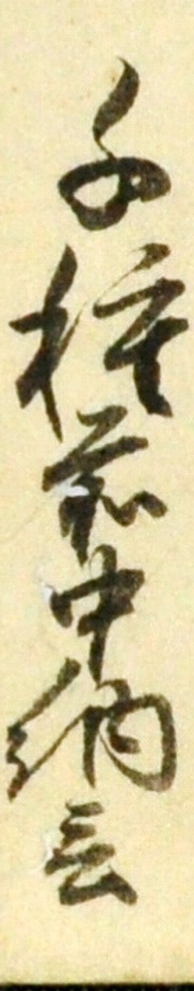千種前中納言
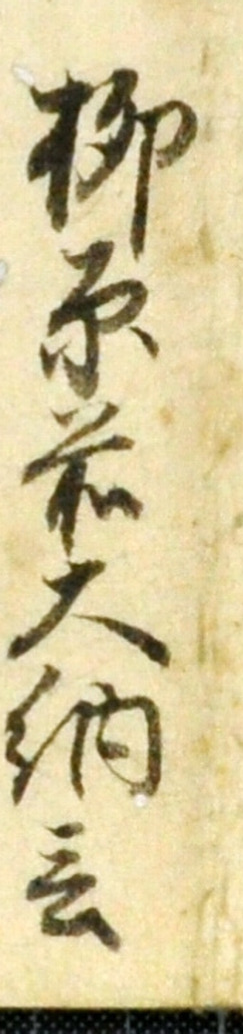柳原前大納言
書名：元禄三年御徳日書上
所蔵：伊那市立高遠町図書館・合同会社AMANE
